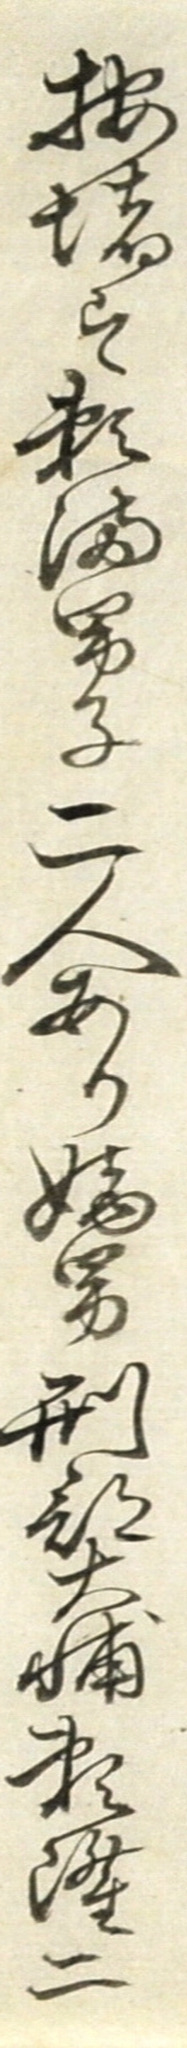按堵す頼満男子二人あり嫡男刑部大輔頼隆二
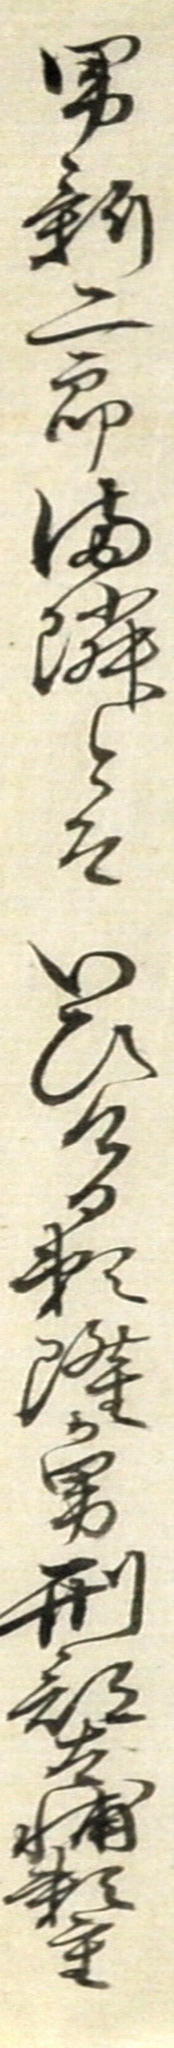男新二郎満隣とそいひける頼隆か男刑部太輔頼重

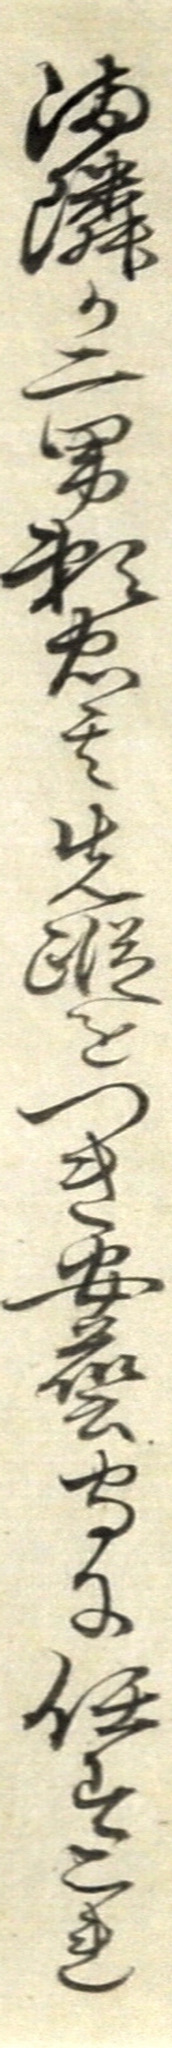満隣か二男頼忠其先蹤をつき安芸守に任すこれ
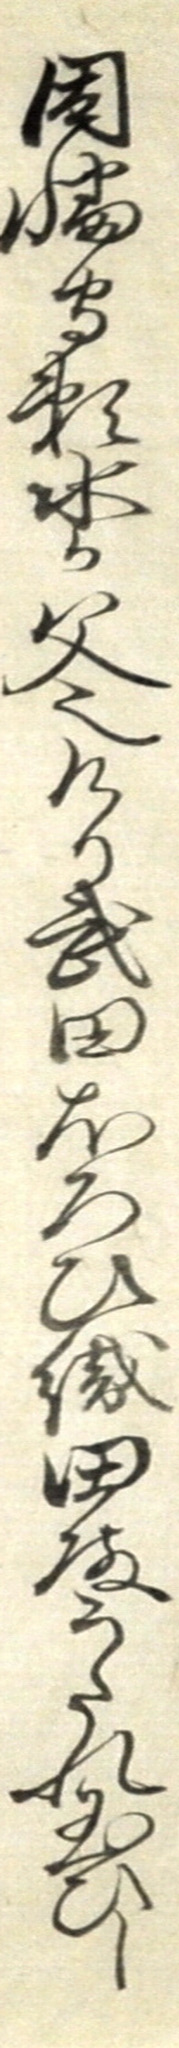因幡守頼水か父也けり武田ほろひ織田殿うたれ玉ひし
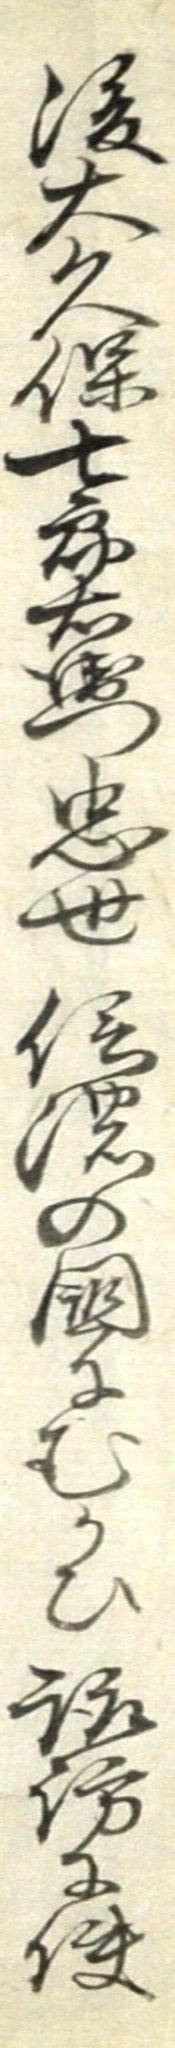後大久保七郎右衛門忠世信濃の国にむかひ諏訪に使
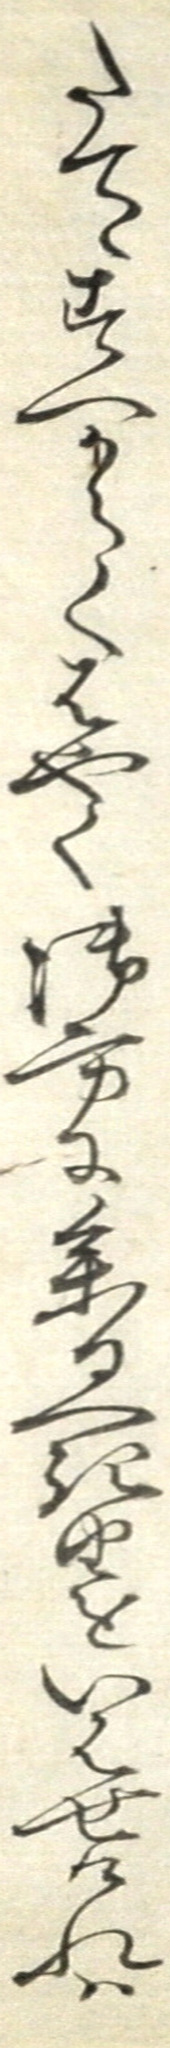たてゝすへからくはやく御方に参るへき由をいはせけれは
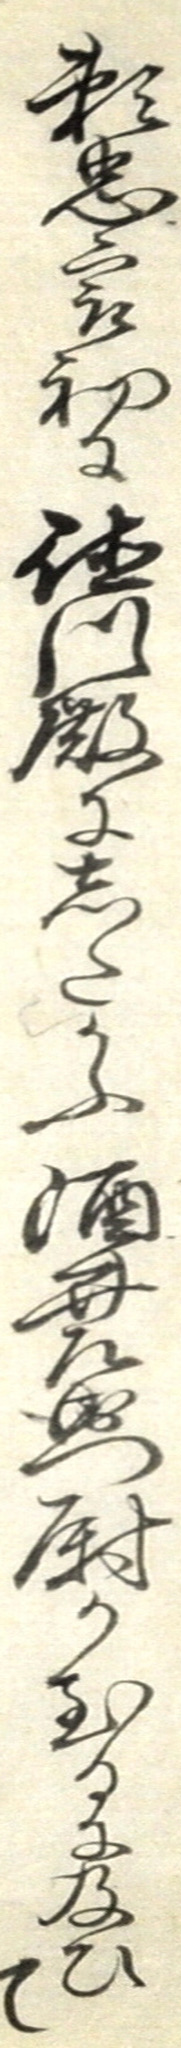頼忠最初に徳川殿にしたかふ酒井左衛門尉か至るに及ひて
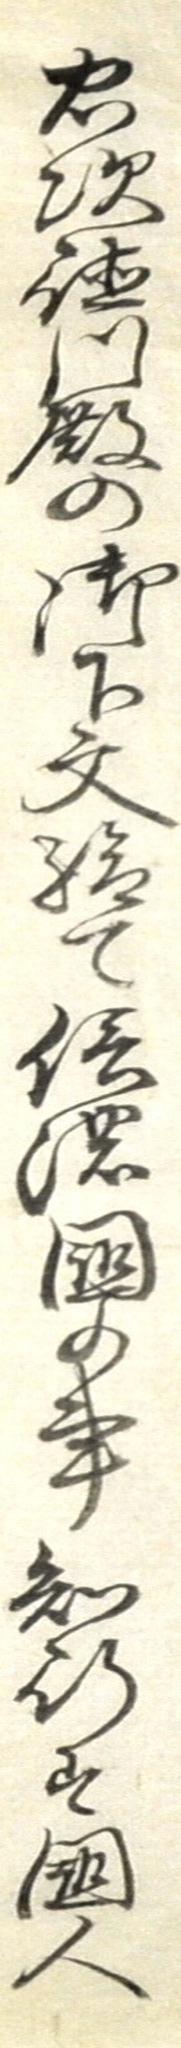忠次徳川殿の御下文給て信濃国の事知行す国人
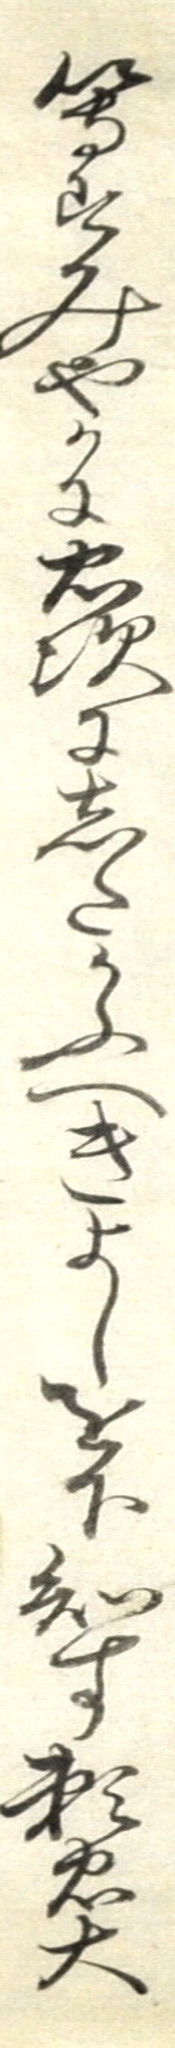等すみやかに忠次にしたかふへきよしを下知す頼忠大
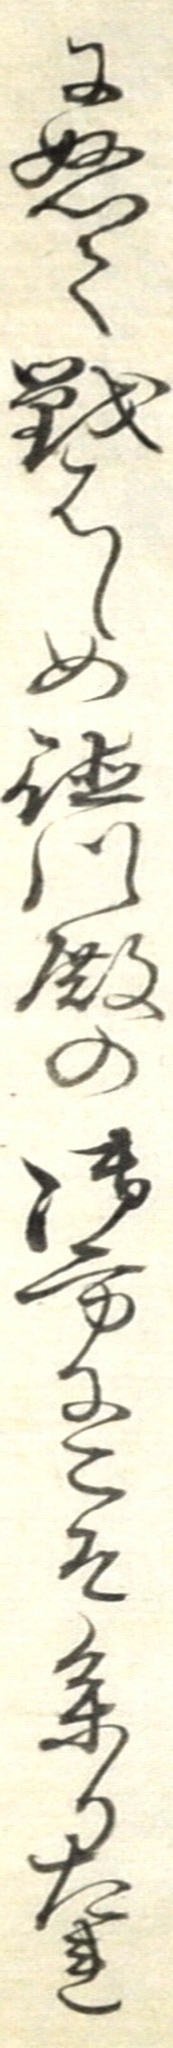に怒て戦はしめ徳川殿の御方にこそ参りたれ
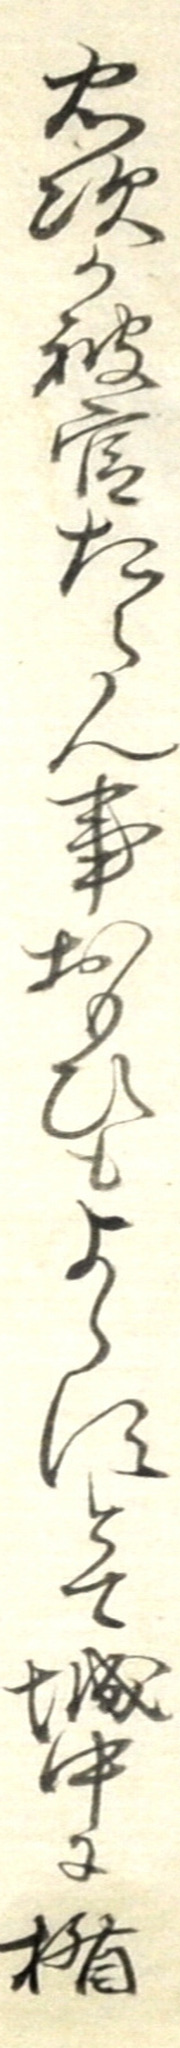忠次か被官たらん事おもひもよらすとて城中に楯
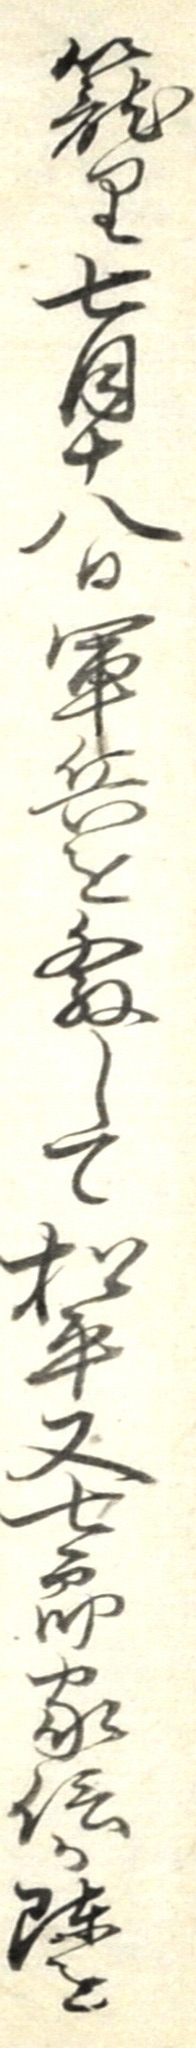籠り七月十八日軍兵を発して松平又七郎家信か陣を
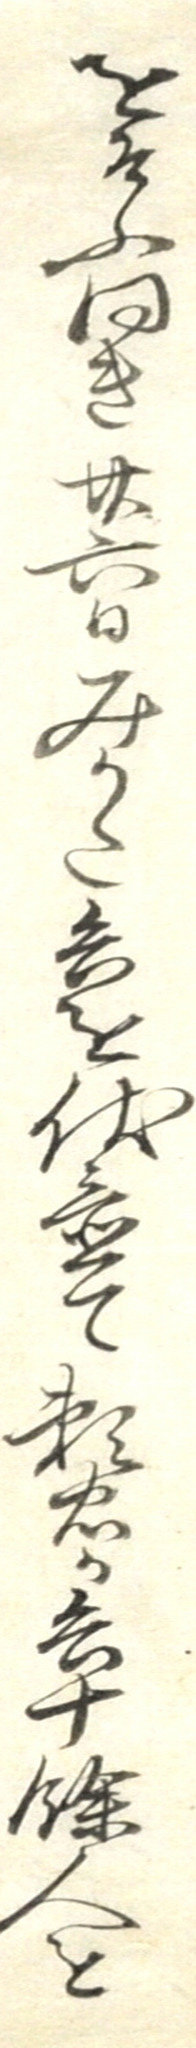をそふ同き廿六日みかた兵を伏置て頼忠か兵十余人を
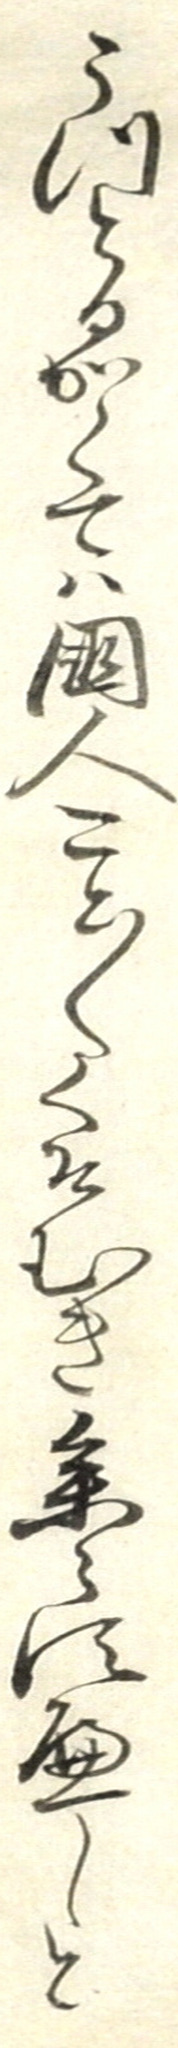うつとるかくては国人こと〳〵くそむき参らすへしと
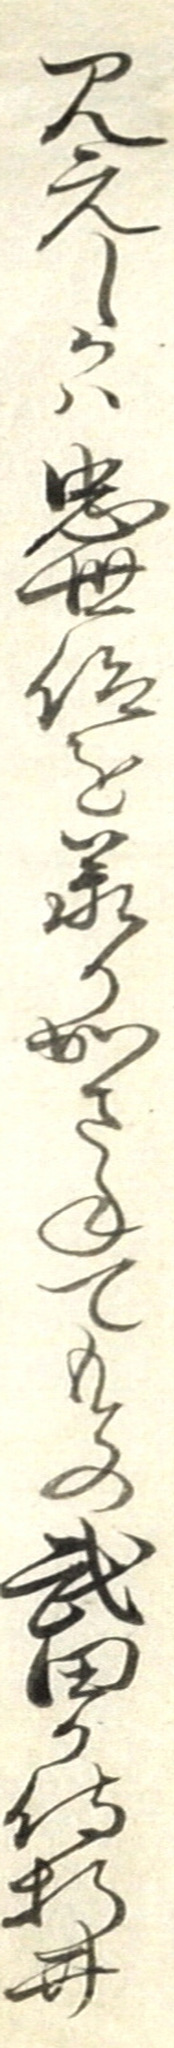見えしかは忠世仰を承りかさねてもとの武田か侍折井
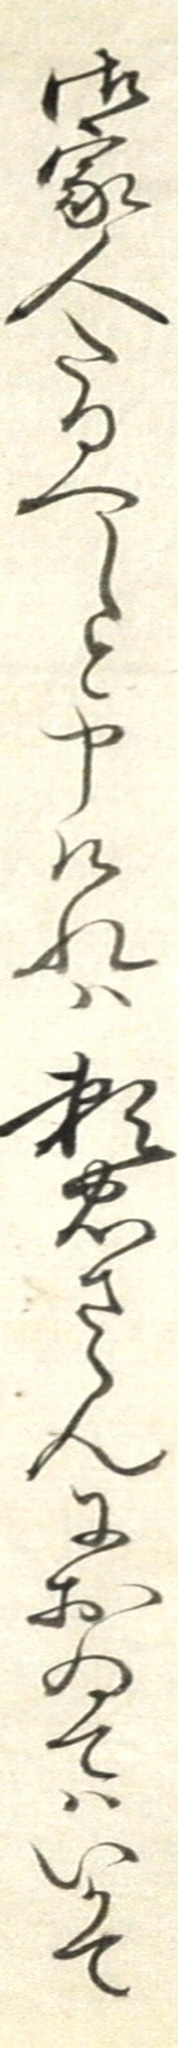御家人たるへしと申けれは頼忠さらんにおゐてはいかて
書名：藩翰譜（六）
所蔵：伊那市立高遠町図書館・合同会社AMANE
